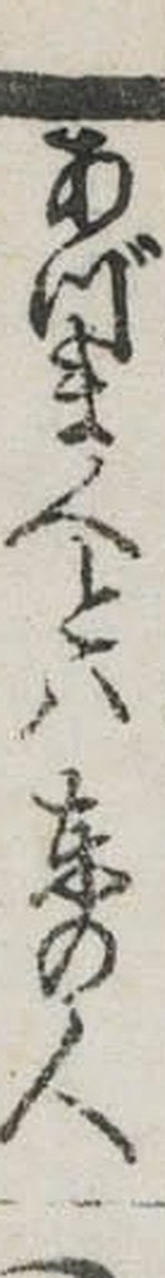あづま人とは東の人
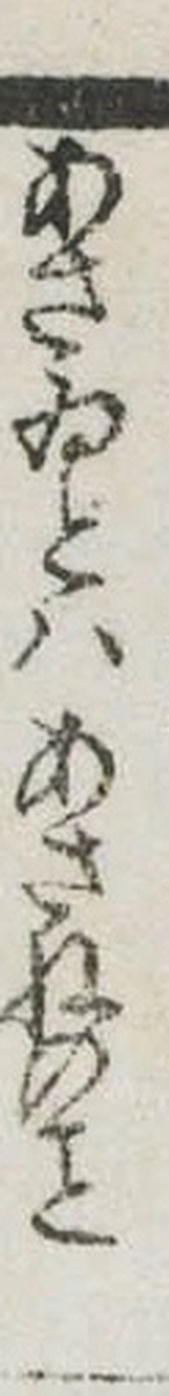あさゐとはあさねのこと
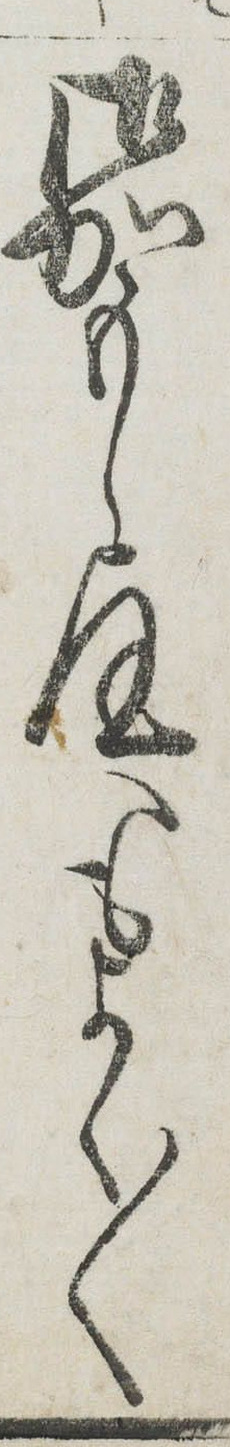御かもしさまへもよく〳〵
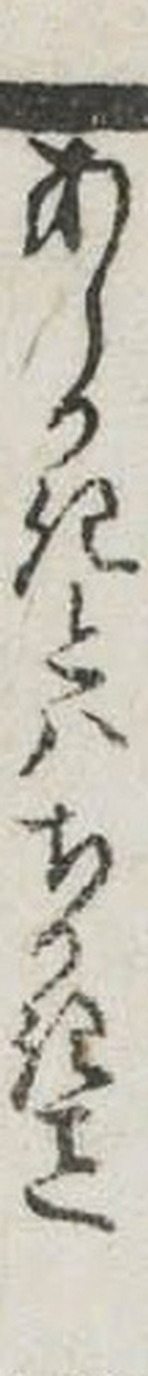あしかきとはちかきこと
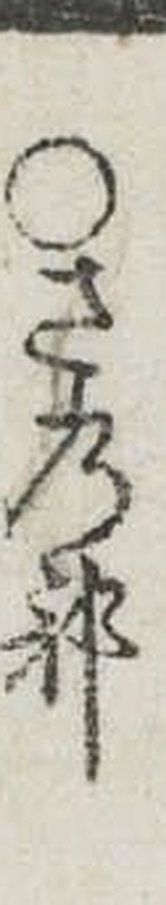○さの部
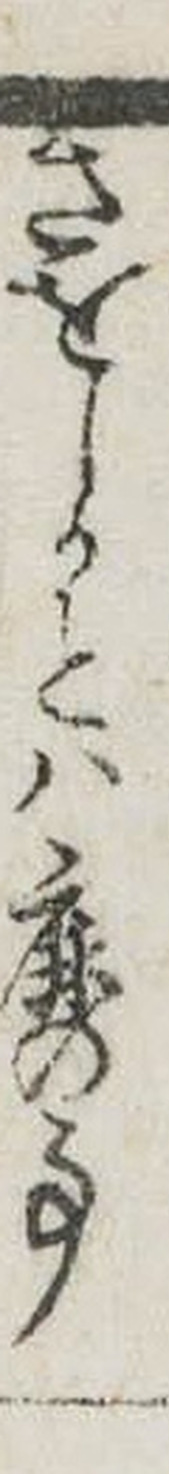さをしかとは鹿の事
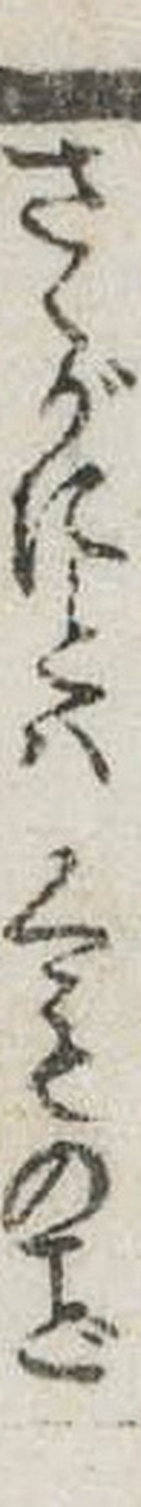さゝがにとはくものこと
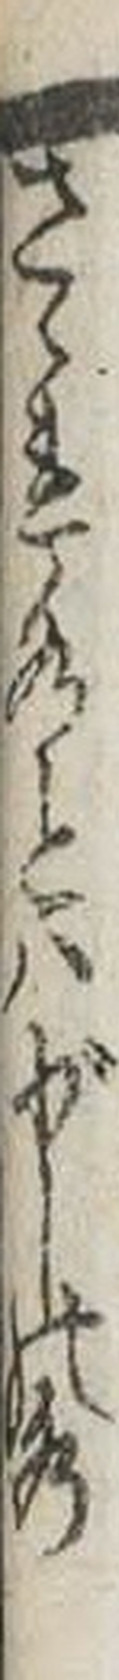さゝれ水とは少しの水
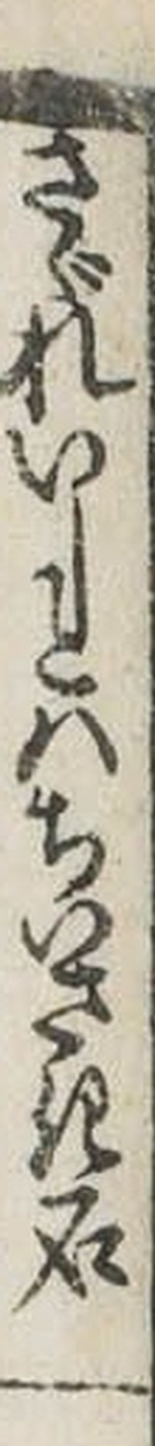さゞれいしとはちいさき石
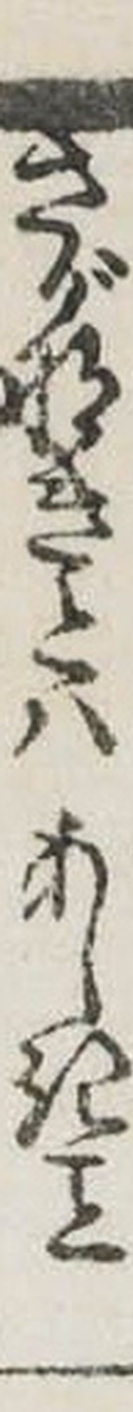さがなきとはあしき事
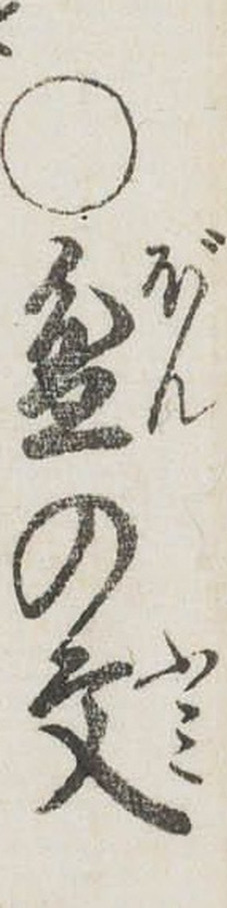○盆の文
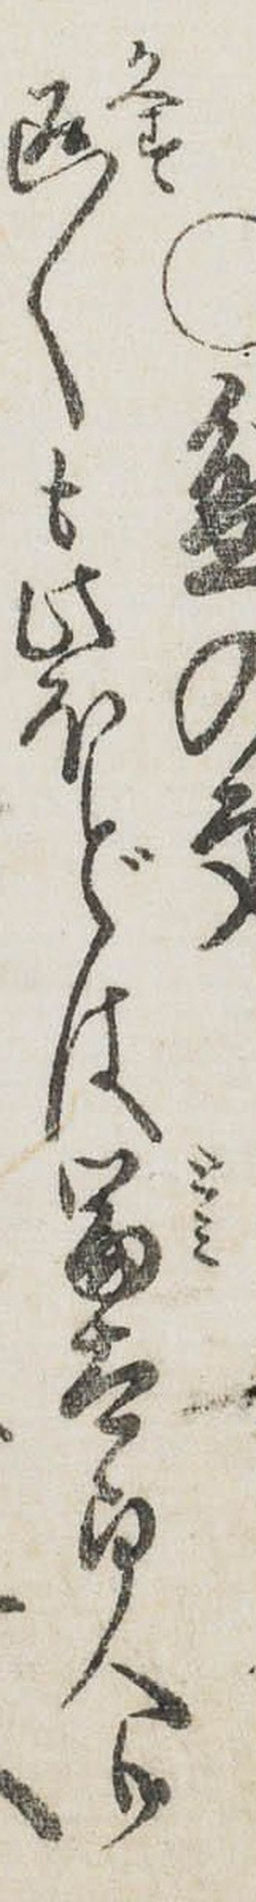返〳〵も此ほとは富太郎へ御
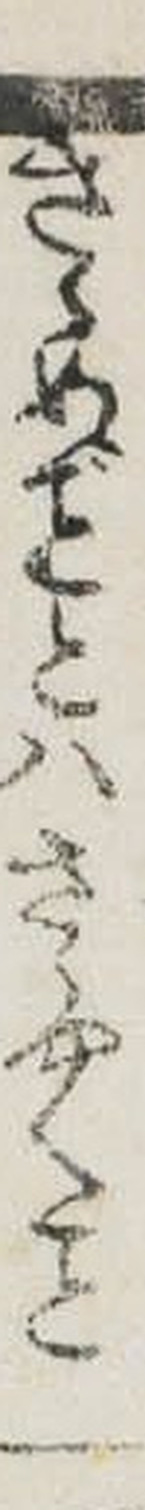さゝめごととはさゝやくこと
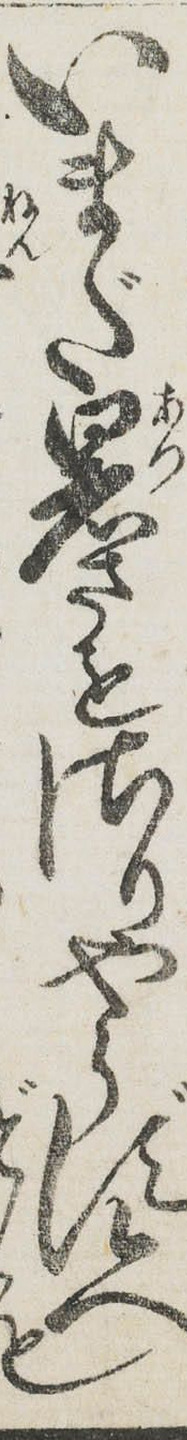いまだ暑さもさりやらず候へども
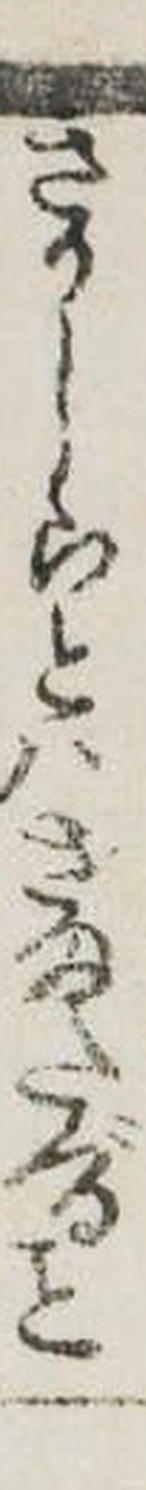さかしらとはさまたぐること
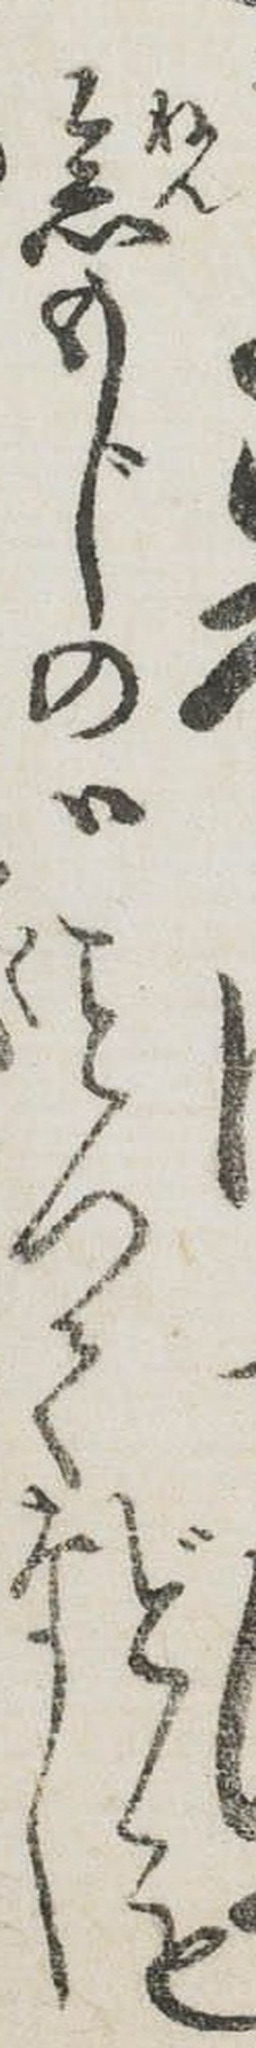念もじの御ことつてなし
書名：頭書萬用婦人手紙之文言
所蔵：東京学芸大学教育コンテンツアーカイブ
